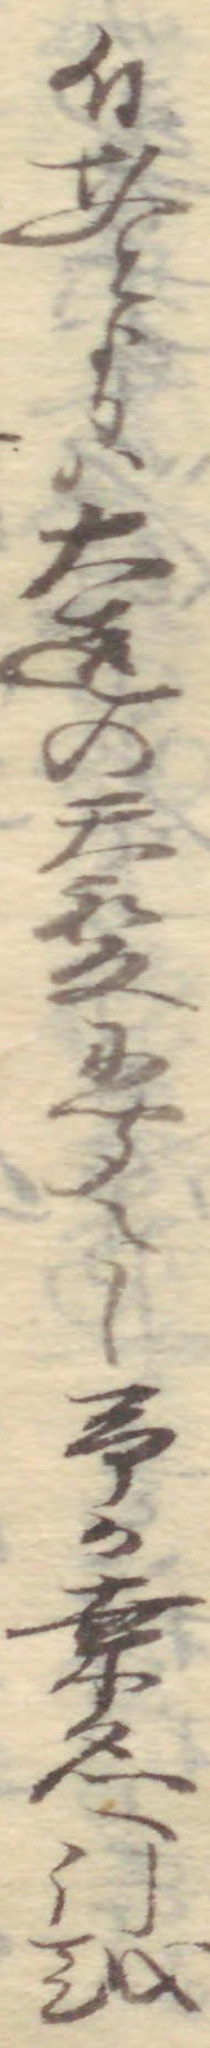付なとよりハ大造の天変に聞之候予か桑名へ引越
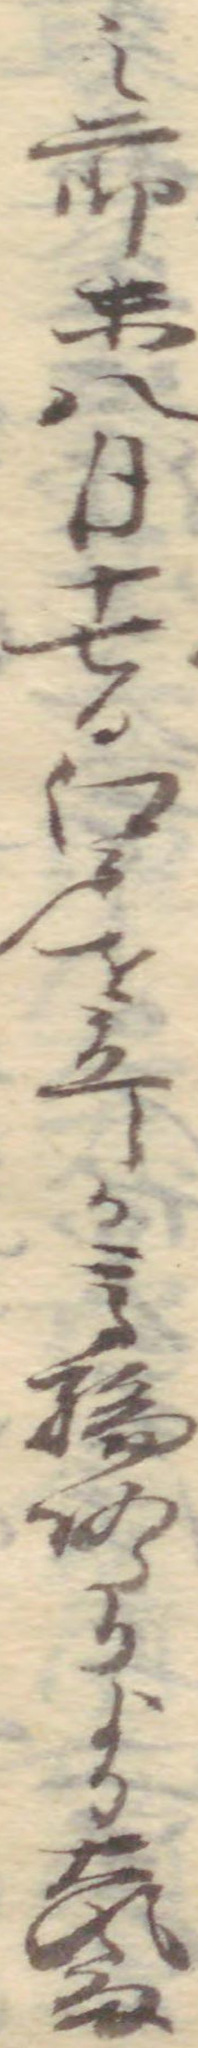之節未八月十七日江戸を立候か高輪あたりより大風雨
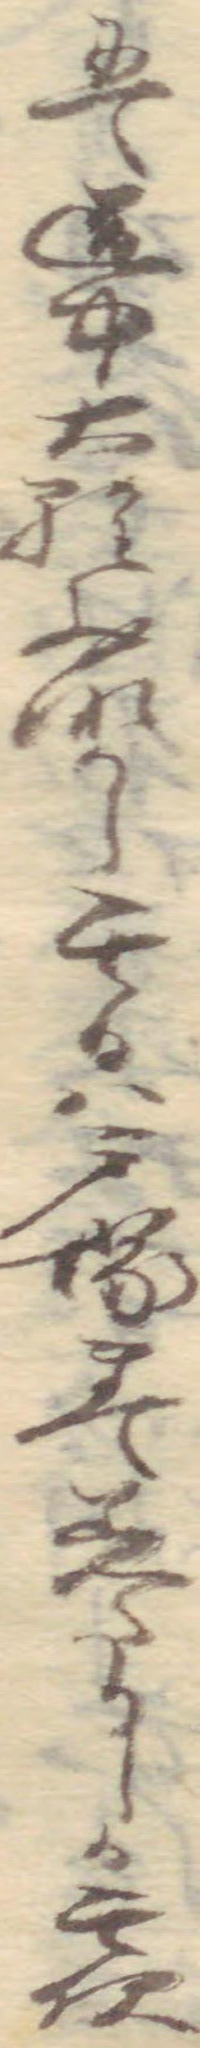にて道中大難義なから其日ハ戸塚まて着たりしか其夜
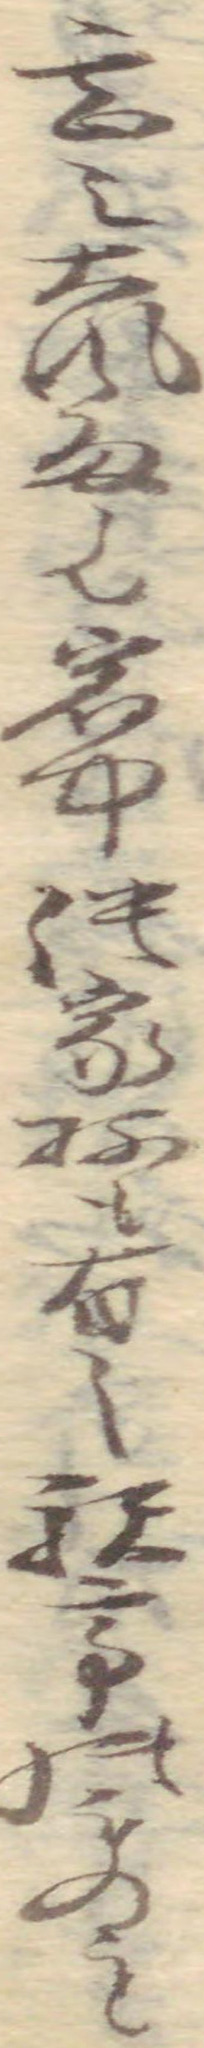甚之大風雨ニて宿中潰家抔も有之駅亭のものも
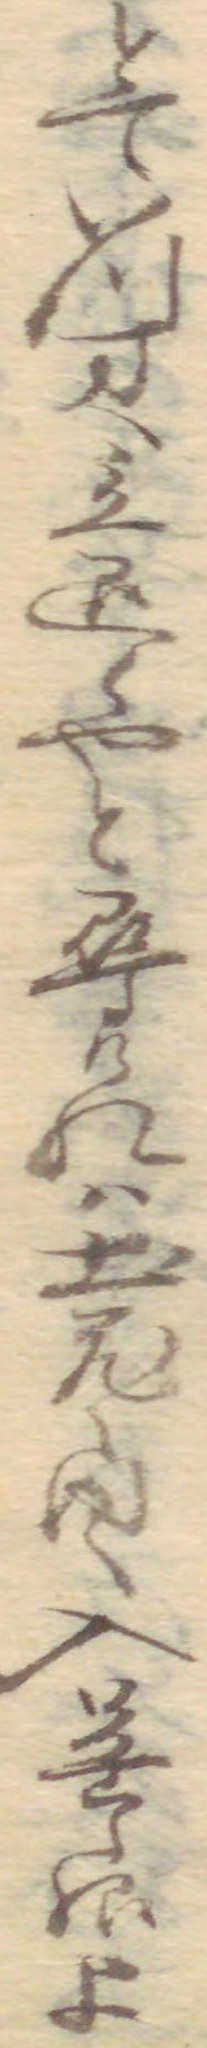とていつ方へ立退くやと尋けれハ土蔵之内へ入呉候様よ
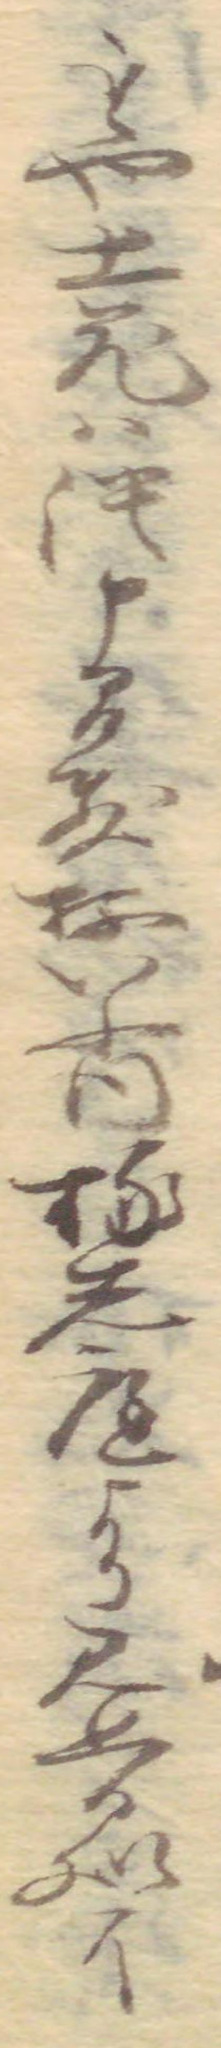もや土蔵ハ潰申間敷抔いふ内極先庭より見上る処に

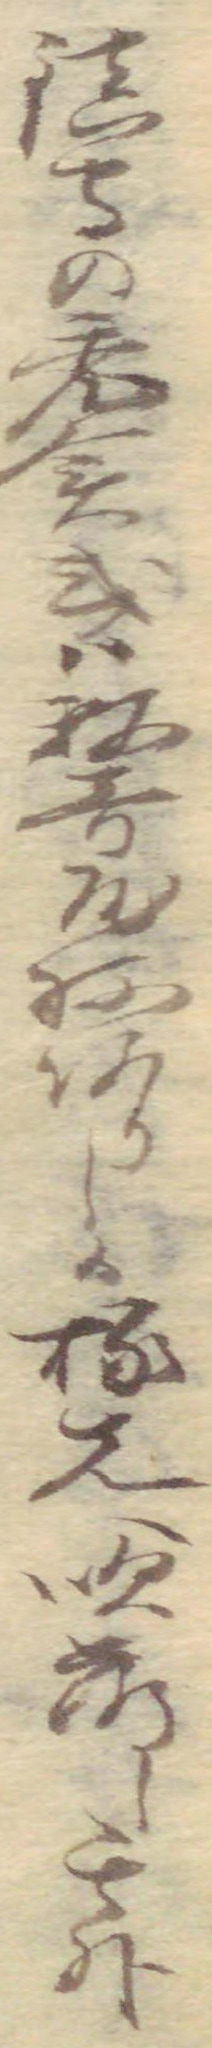鎮守の禿倉或ハ数寄屋抔ありしが極先へ吹落候其外
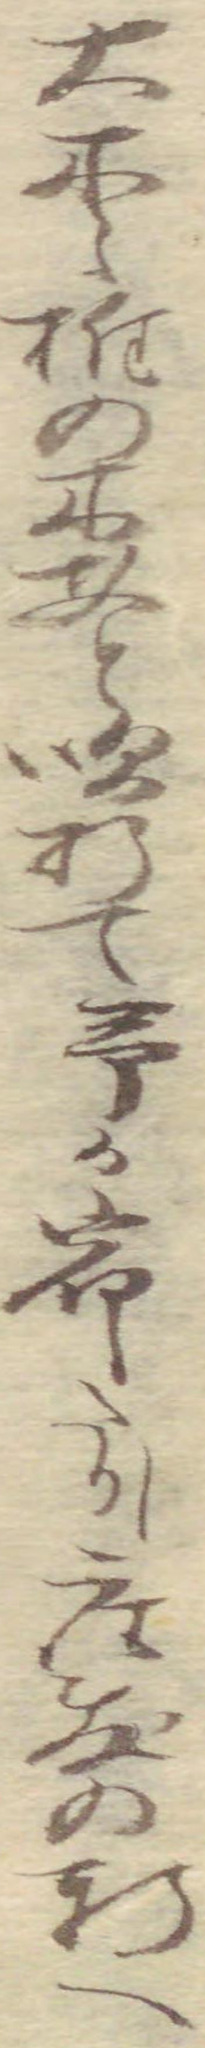大木の椎の木なと吹折て予が宿したりし座敷の軒へ
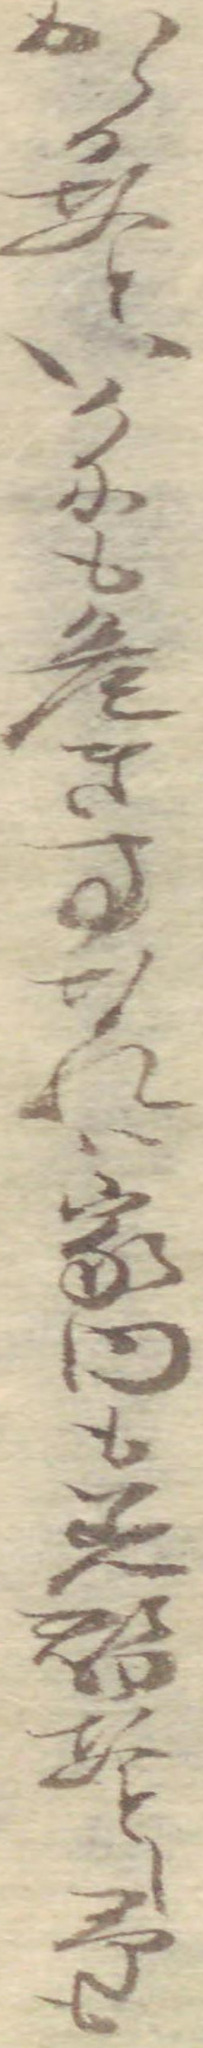かゝるなといかにも危き事なれハ家内も着替なとし予も
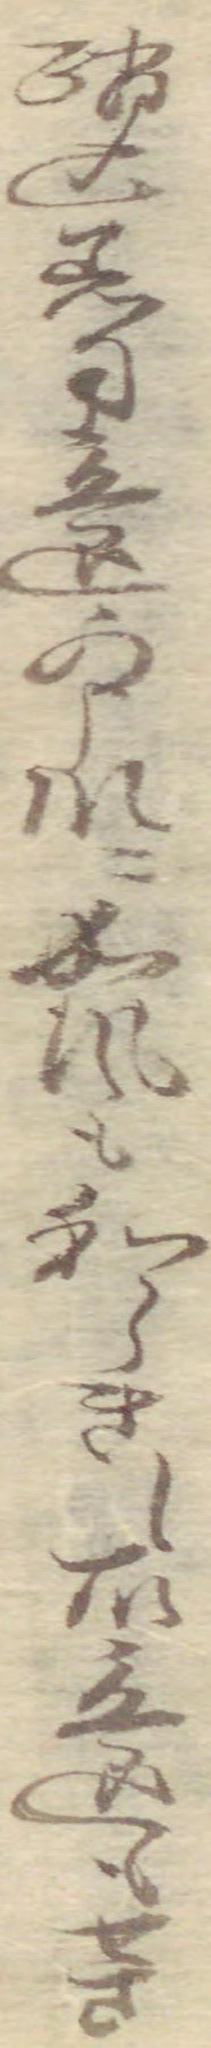踏込着用立退可申段ニ成風も和らきし故立退もせさ
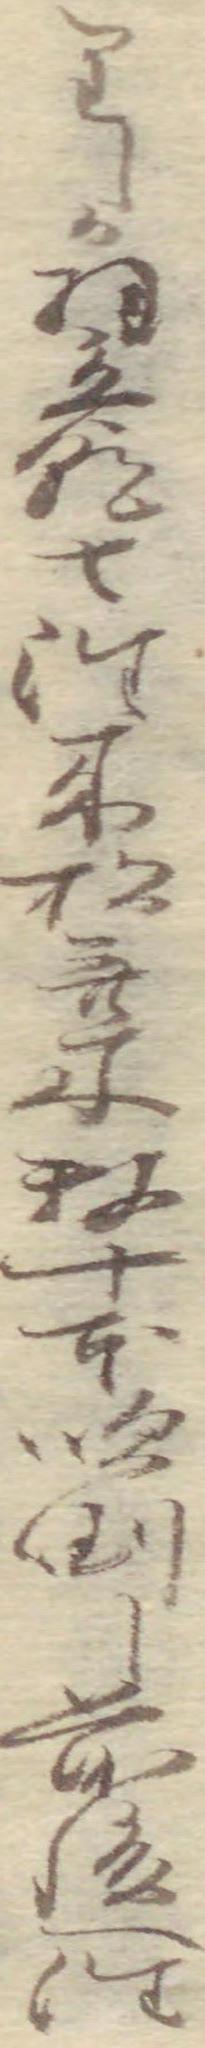りしか翌朝は往来松並木数十本吹倒候前後へ往
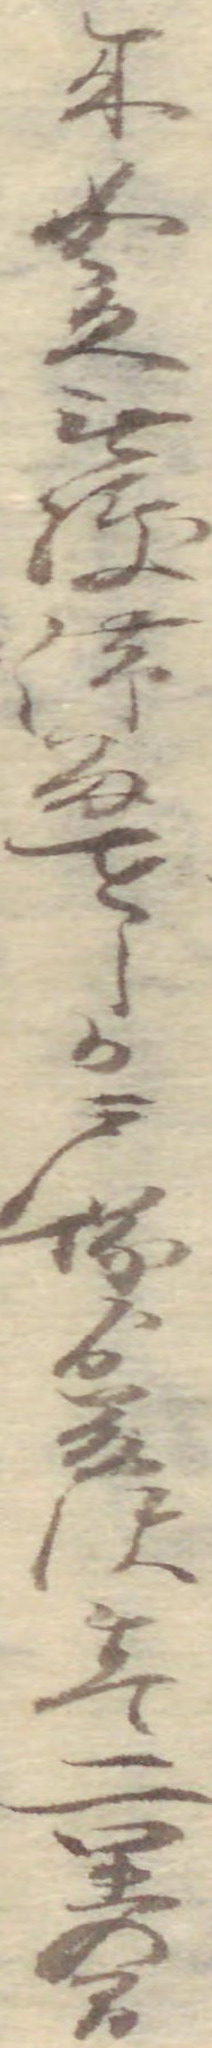来成立無拠滞留せしか戸塚ゟ藤沢まて二里の間
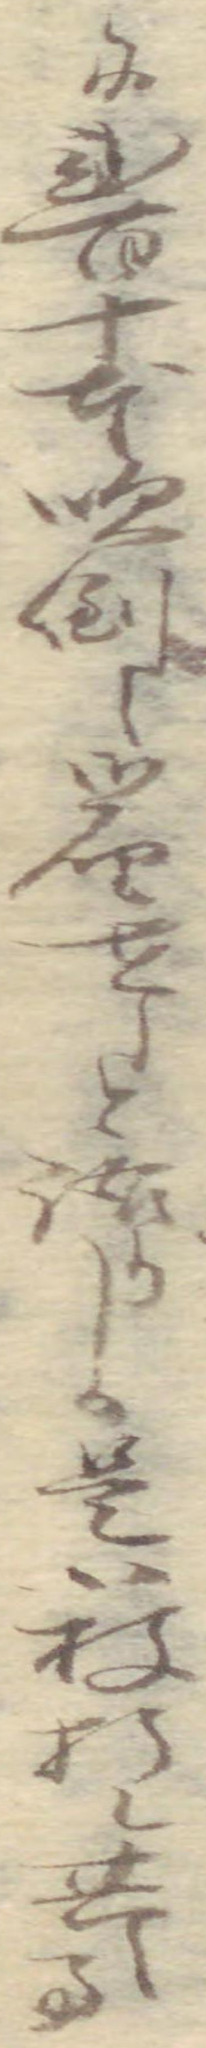に弐百十本吹倒候御届せしと語りしか是は枝折レ甚し事
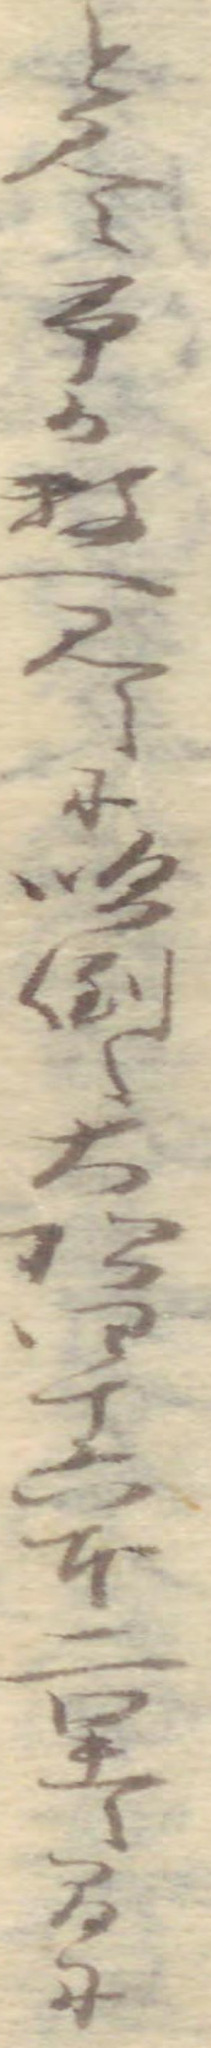と見候予か数へ見候に吹倒候大松四十六本二里之間に
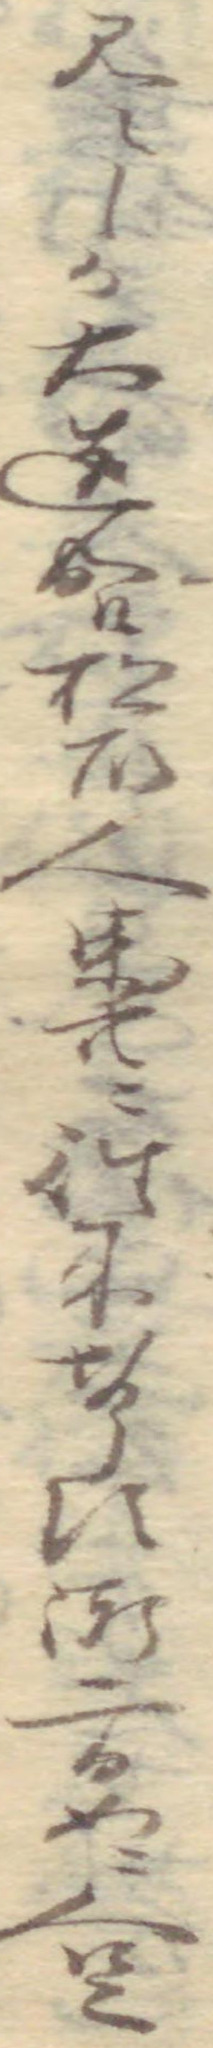見へ候か大造成る松故人馬共に往来ならす漸二日めニ人足
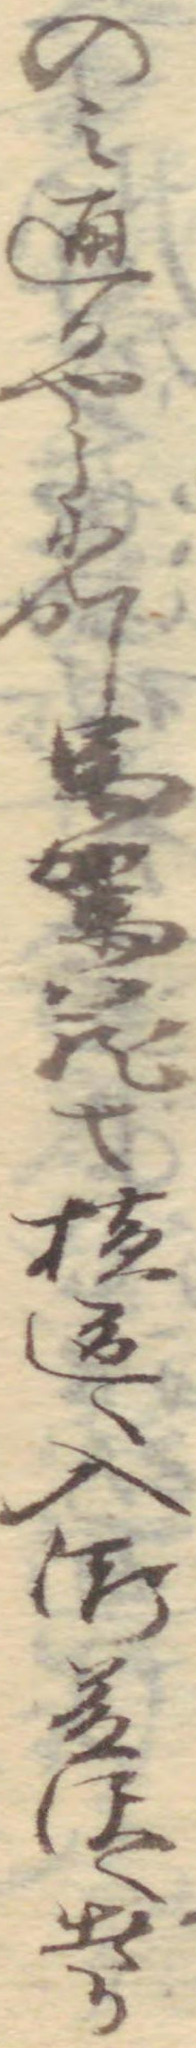のミ通るやうに成し馬駕籠は横道へ入漸藤沢へ出たり
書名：鶯宿雑記. 巻199-200
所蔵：国立国会図書館 National Diet Library, JAPAN
